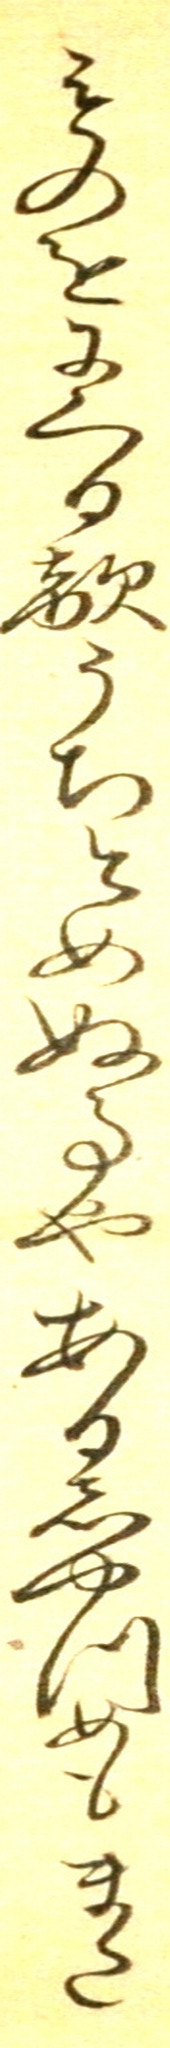ものをにくる敵うちとめぬ事やあるしやつめもまた
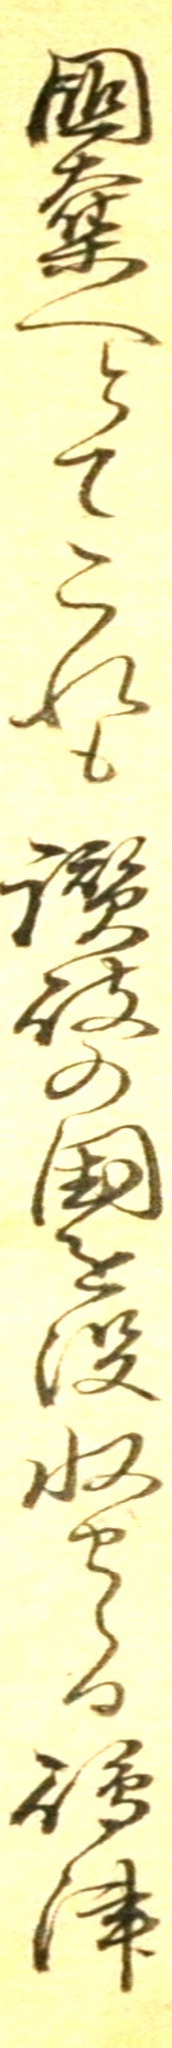国奪へとてこれも讃岐の国を没収せらる島津
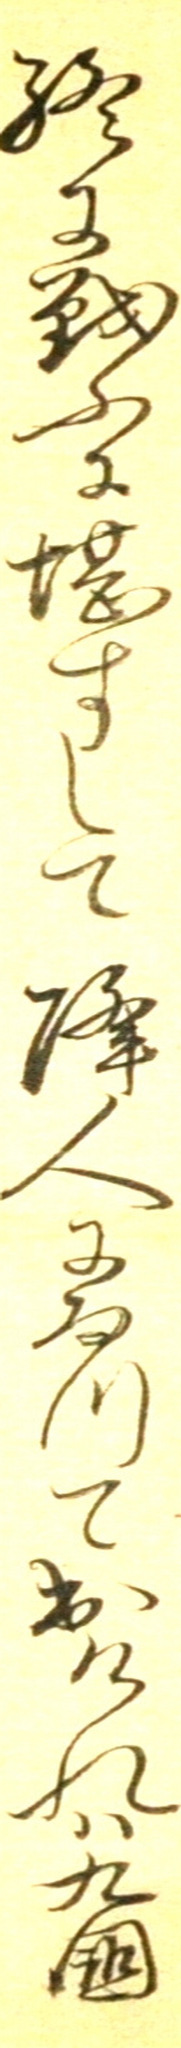終に戦ふに堪すして降人になつて出けれは九国
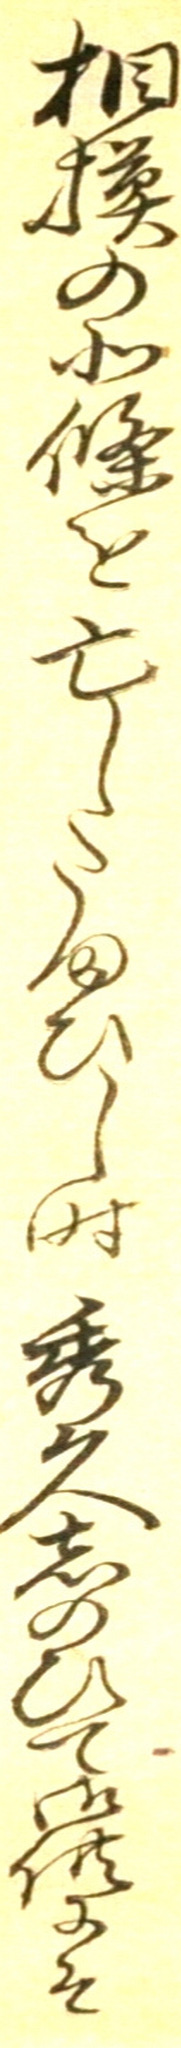相模の北条を亡したまひし時秀久しのひて御供にそ
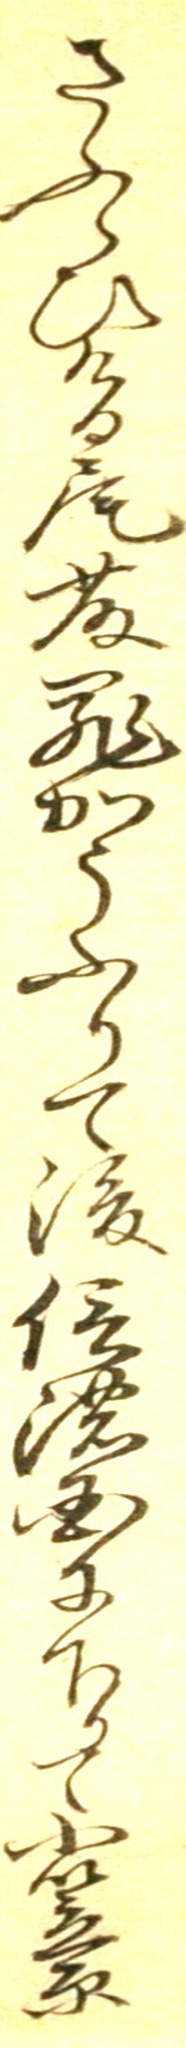さふらひける尾藤罪かうふりて後信濃国に下りて小笠原
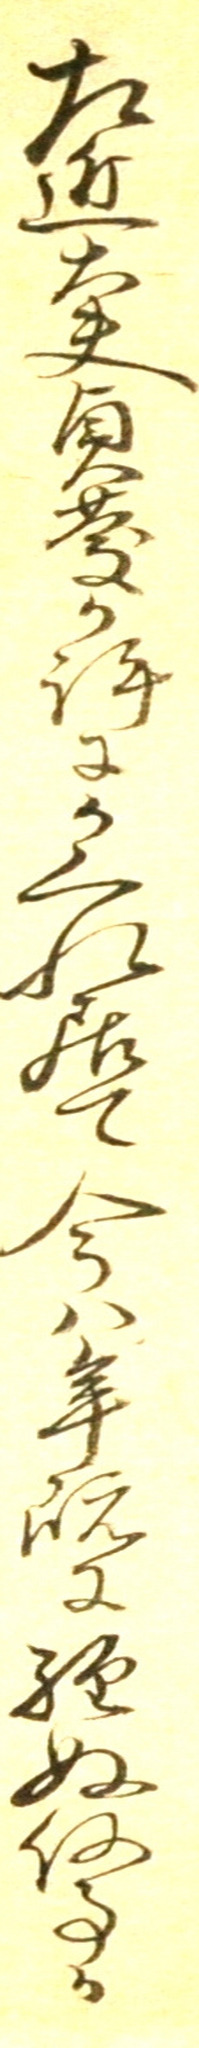左近大夫貞慶か許にかくれ居て今は年既に経ぬ何事か
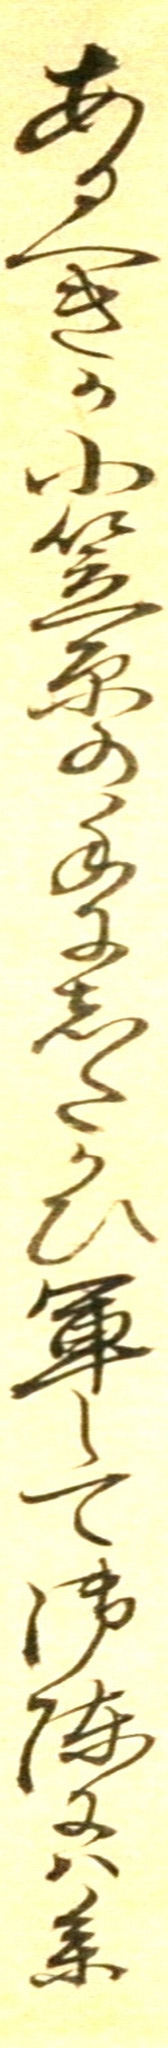あるへきか小笠原の手にしたかひ軍して御陣には参
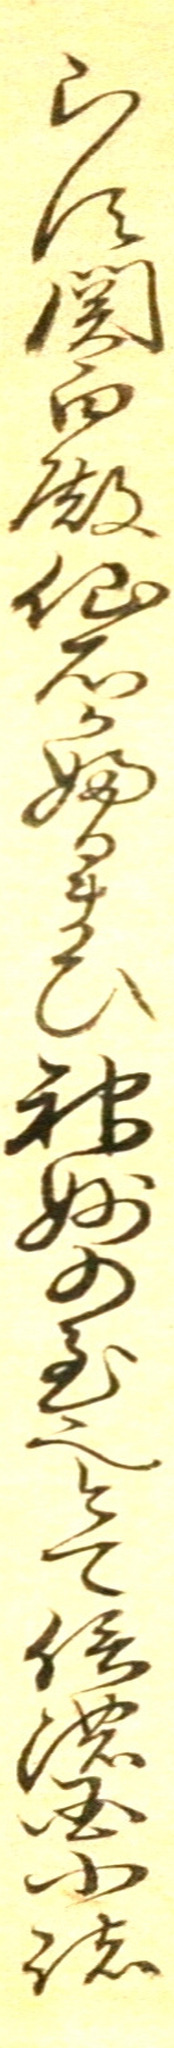らす関白殿仙石かふるまひ神妙の至也とて信濃国小諸
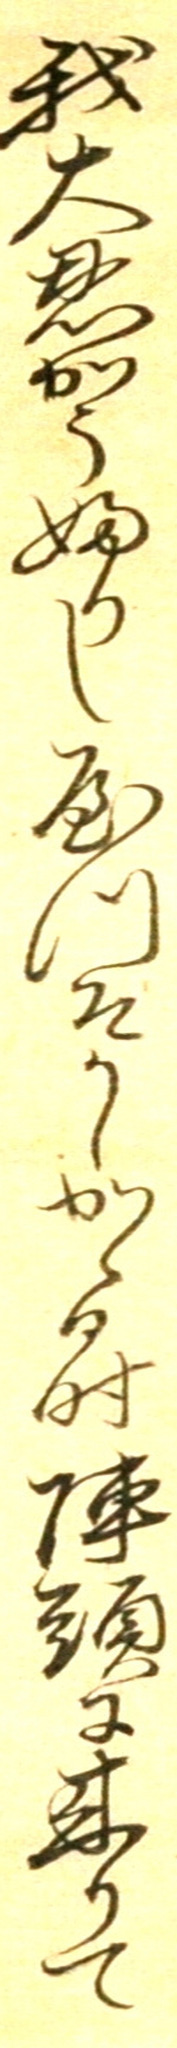我大恩かうふりしやつそかしかゝる時陣頭に来りて
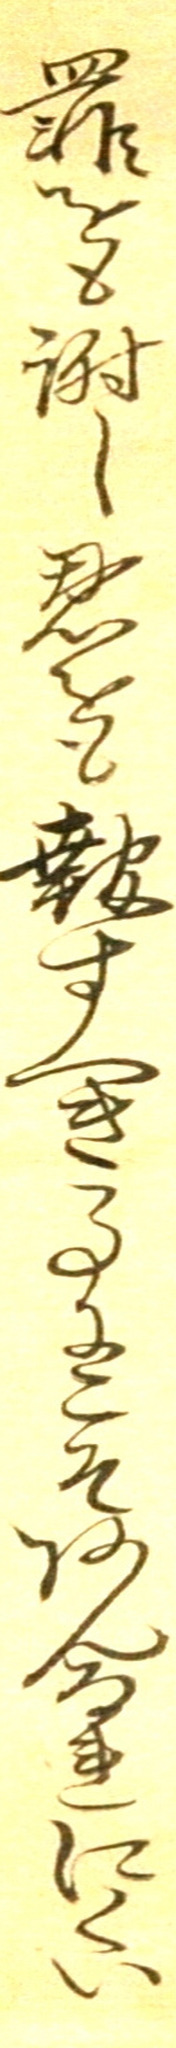罪をも謝し恩をも報すへき事にこそあんなれにくい
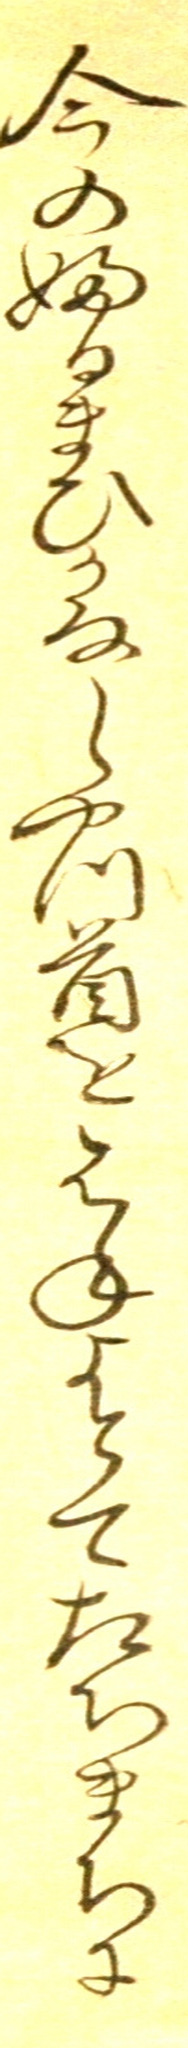今のふるまひかなしやつ首をはねよとてたちまちに

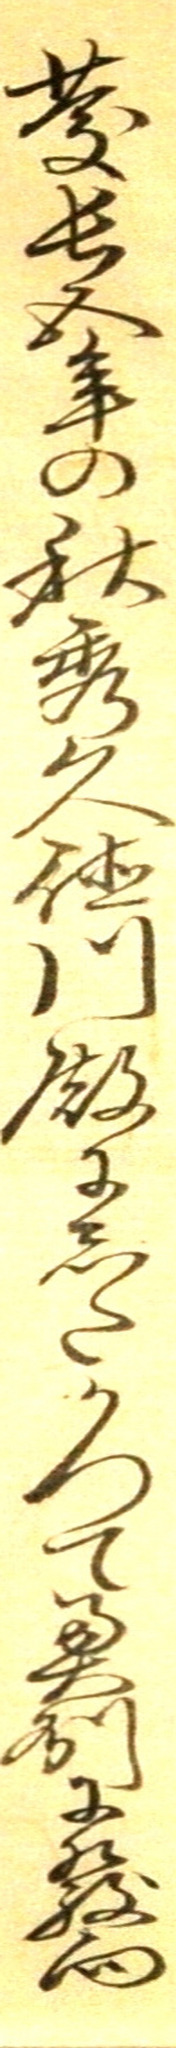慶長五年の秋秀久徳川殿にしたかつて奥州に発向
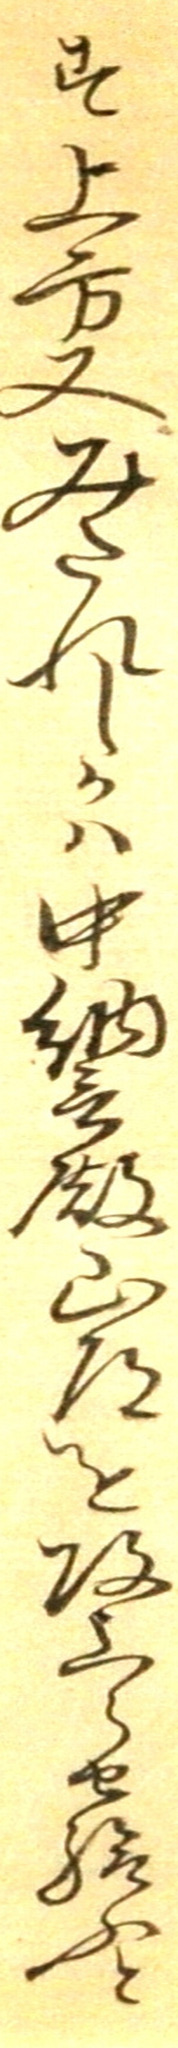す上方又みたれしかは中納言殿山道を攻上らせ給ふと
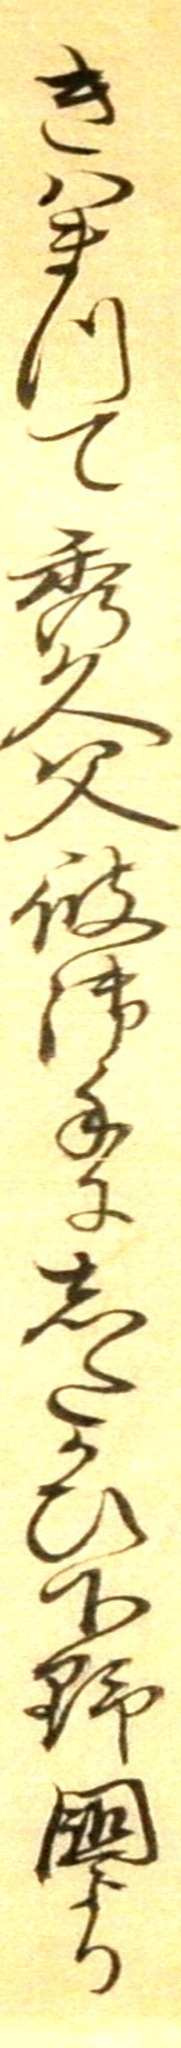きはまつて秀久父彼御手にしたかひ下野国より
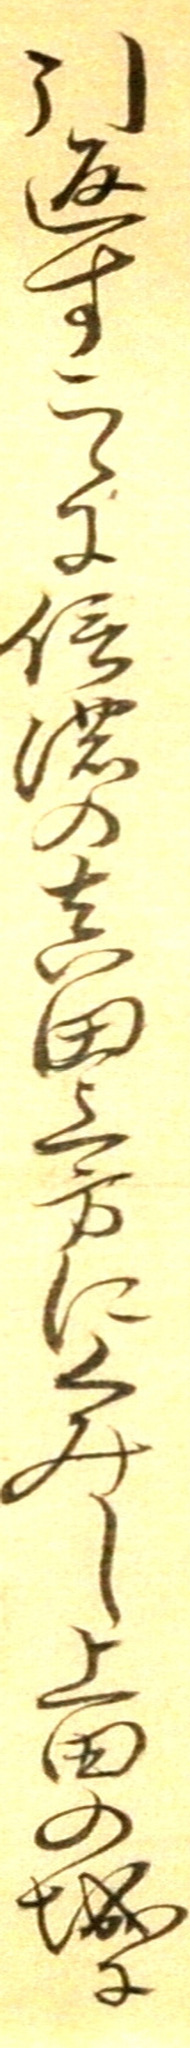引返すこゝに信濃の真田上方にくみし上田の城に
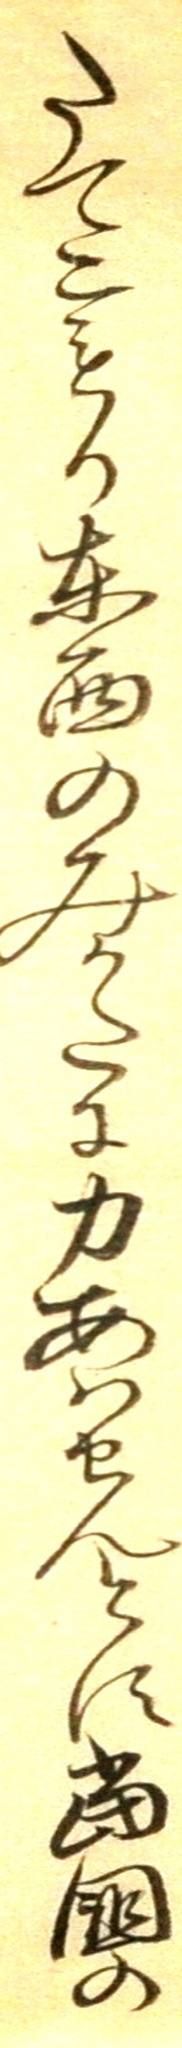たてこもり東西のみかたに力あはせんとす当国の
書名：藩翰譜（九・上）
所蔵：伊那市立高遠町図書館・合同会社AMANE
